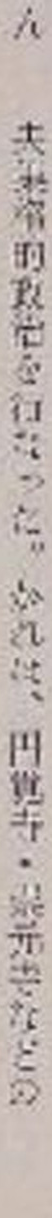央集権的政治を行なった。かれは、円覚寺・崇元寺などの
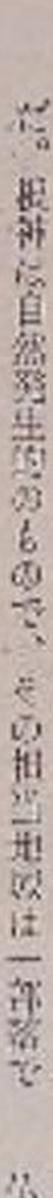だ、根神は自然発生的のもので、その担当地域は一部落で
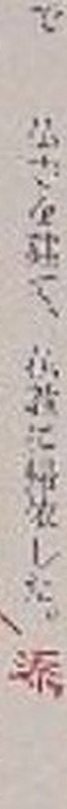仏寺を建て、仏教に帰依した。
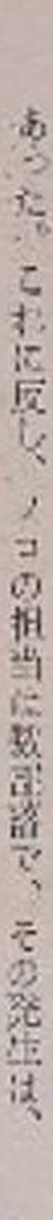あった。これに反し、ノロの担当は数部落で、その発生は、
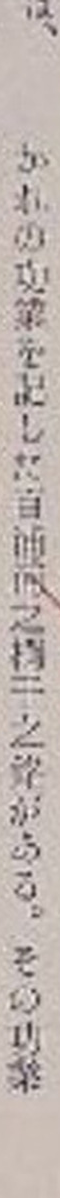かれの功業を記した百浦添之欄干之銘がある。その功業
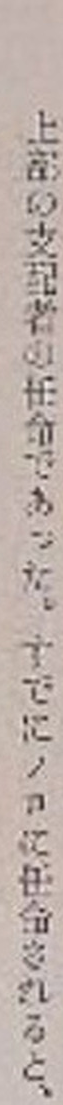上部の支配者の任命であった。すでにノロに任命されると、
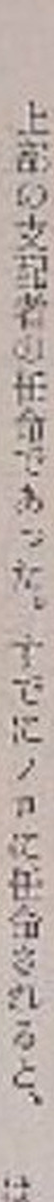上部の支配者の任命であった。すでにノロに任命されると、
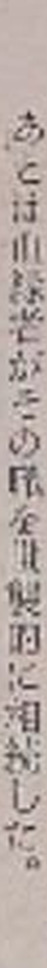あとは血縁者がそのを世襲的に相続した。
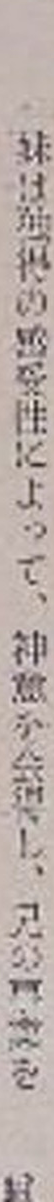妹は独特の感受性によって、神意を会得し、兄の事業を
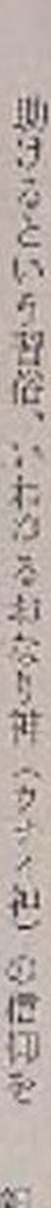助けるという習俗、いわゆるおなり神(ウナイ神)の信仰を
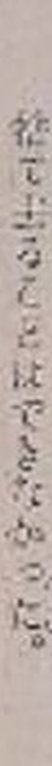捨て去ることはできなかった。
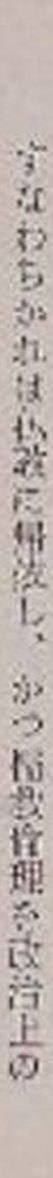すなわちかれは仏教に帰依し、かつ儒教倫理を政治上の
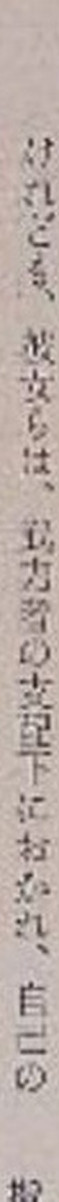けれども、彼女らは、武力者の支配下におかれ、自己の
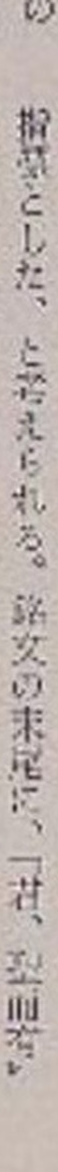指標とした、と考えられる。銘文の末尾に、「君、聖而有
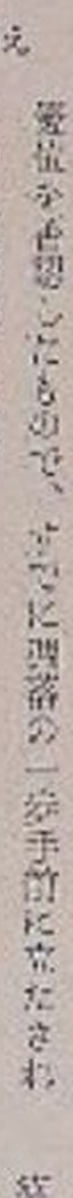を否認したもので、すでに凋落の一歩手前に立たされ
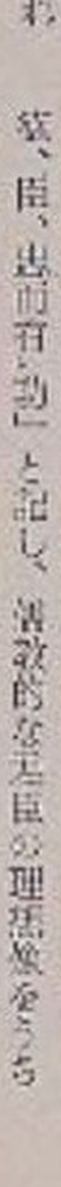、臣、忠而有功」と記し、儒教的な君臣の理想像をうち
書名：沖縄固有信仰のおとろえ
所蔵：University of the Ryukyus Library
